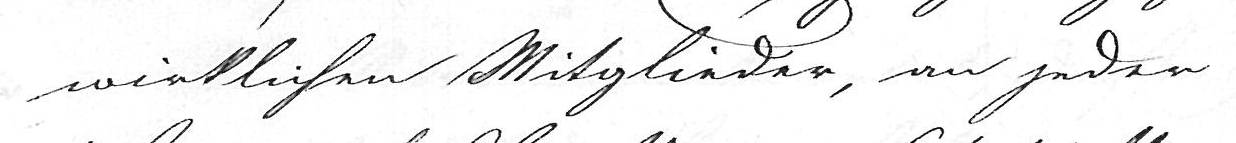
wirklichen Mitglieder, an jeder
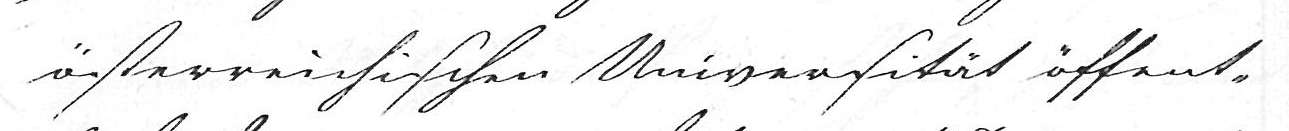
österreichischen Universität öffent-
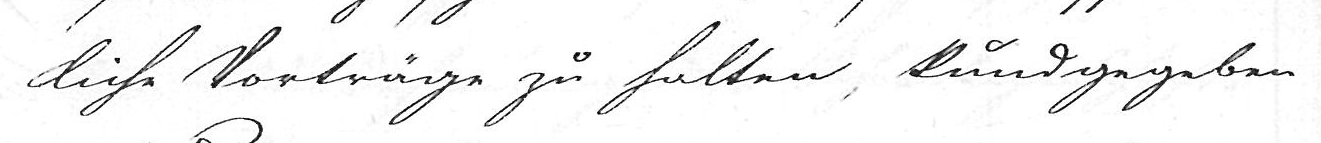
liche Vorträge zu halten, kundgegeben
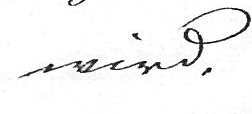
wird.
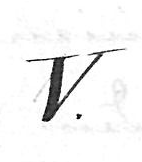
V.
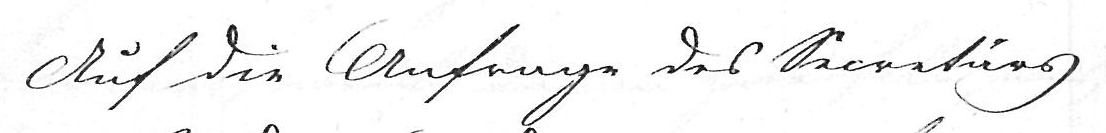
Auf die Anfrage des Secretärs
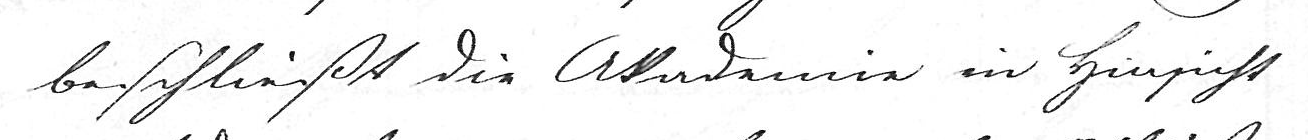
beschließt die Akademie in Hinsicht
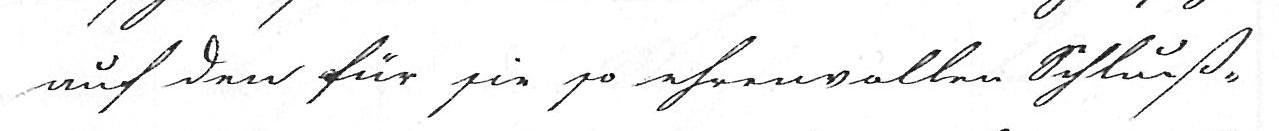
auf den für sie so ehrenvollen Schluß-
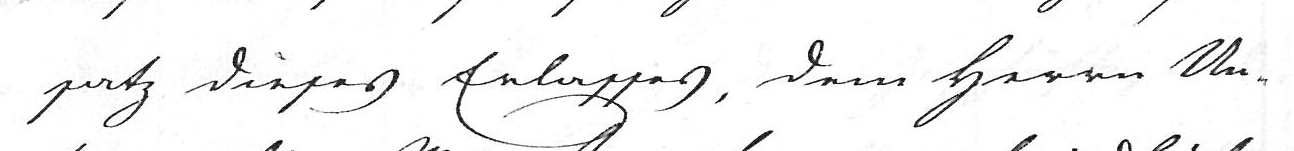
satz dieses Erlasses, dem Herrn Un-
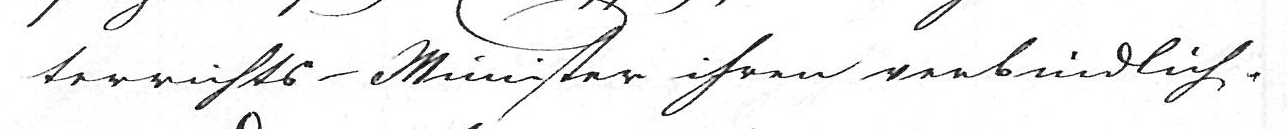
terrichts-Minister ihren verbindlich-
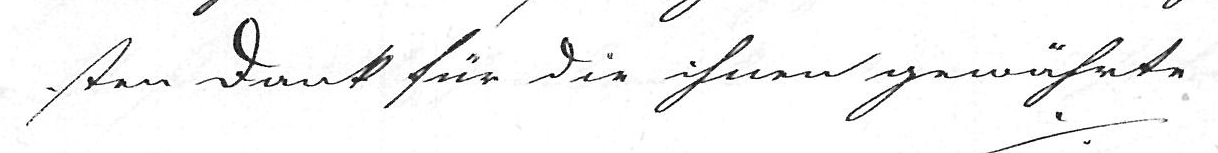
sten den für die ihnen gewährte
